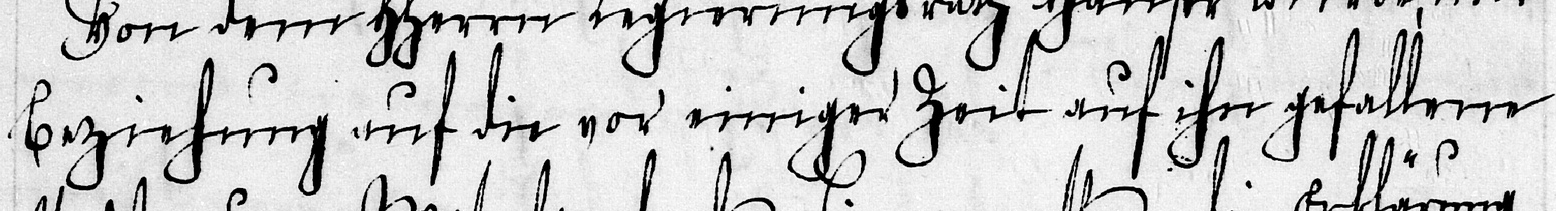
Beziehung auf die vor einiger Zeit auf ihn gefallene
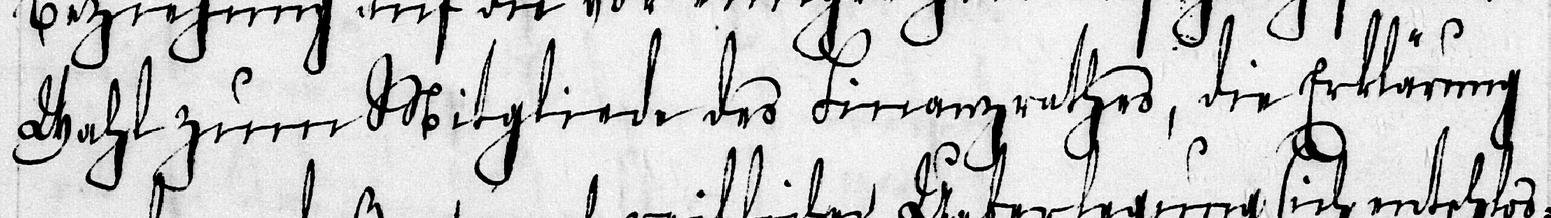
Wahl zum Mitgliede des Finanzrathes, die Erklärung
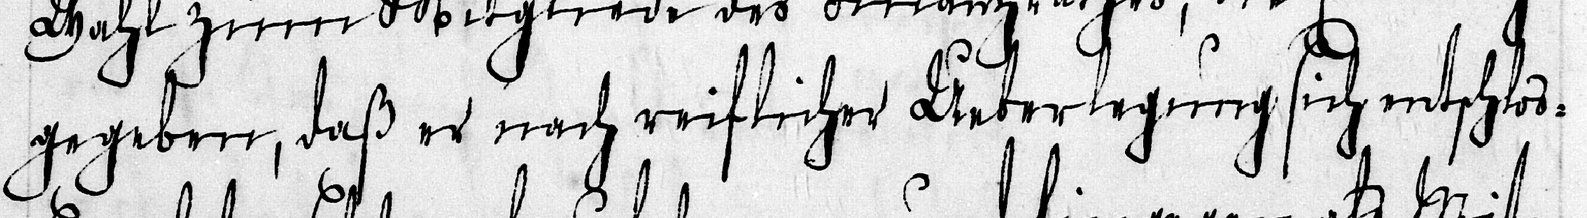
gegeben, daß er nach reiflicher Ueberlegung sich entschloß¬
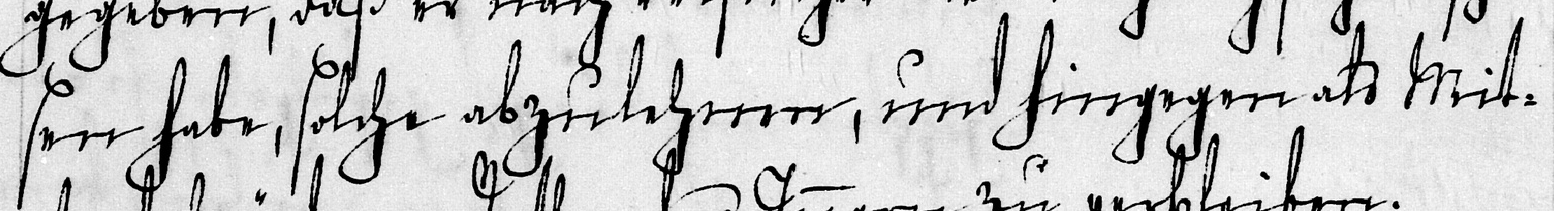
en habe, solche abzulehnen, und hingegen als Mit¬
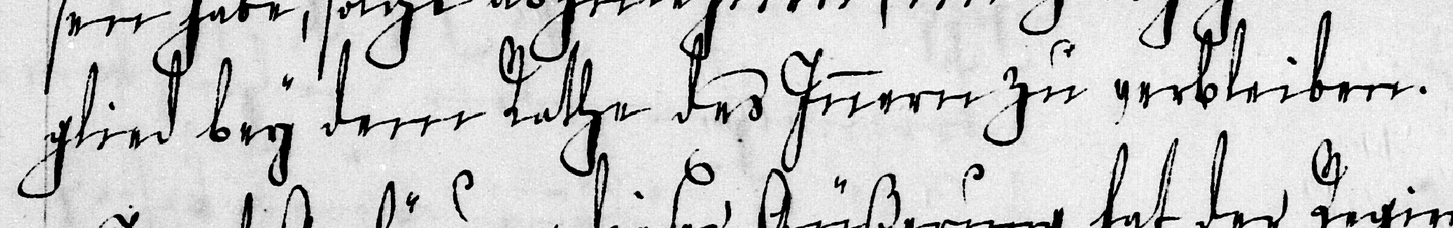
glied bey dem Rathe des Innern zu verbleiben.
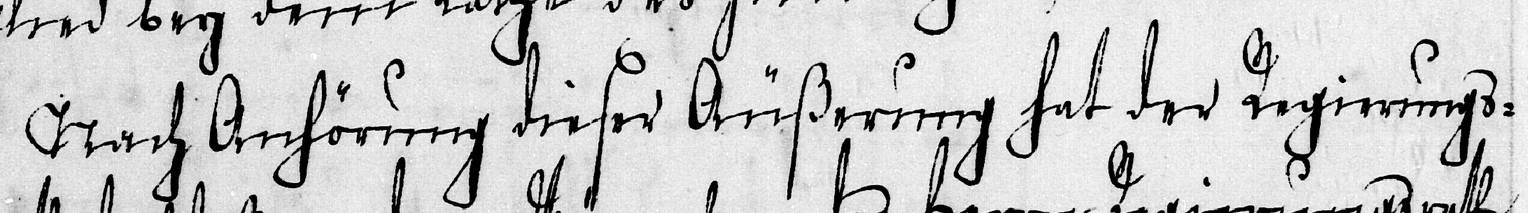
Nach Anhörung dieser Äußerung hat der Regierungs¬
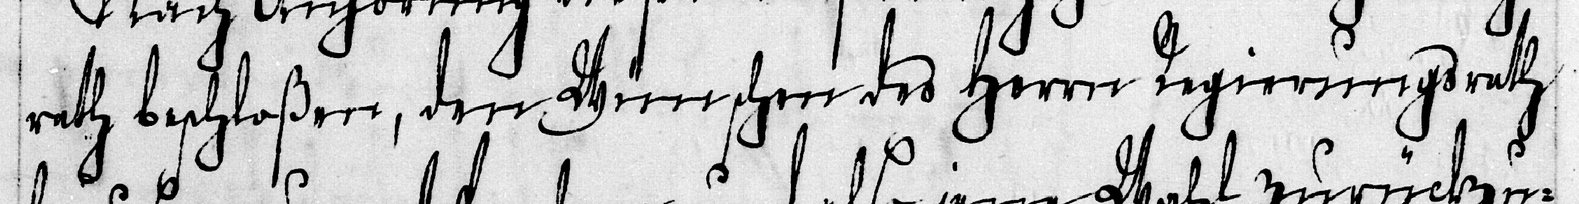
rath beschloßen, den Wünschen des Herrn Regierungsrath
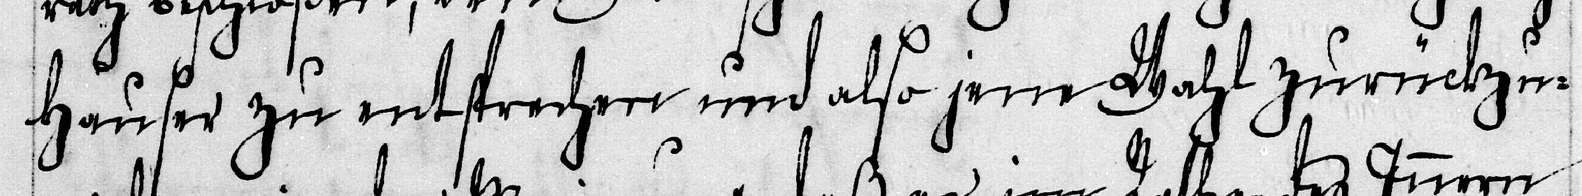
Hauser zu entsprechen und also jene Wahl zurückzu¬
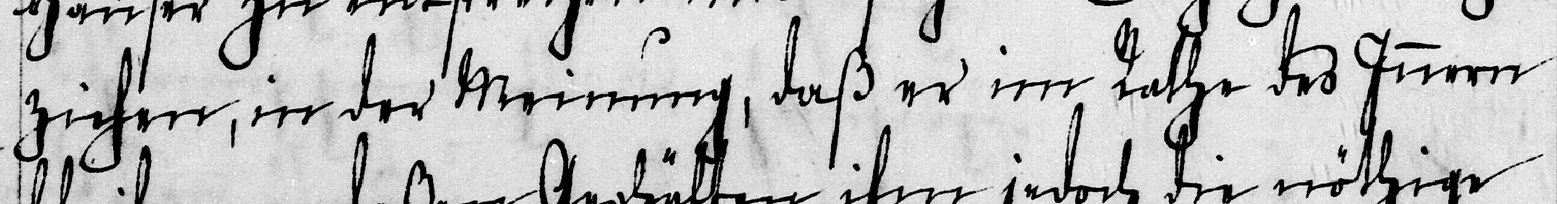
ziehen, in der Meinung, daß er im Rathe des Innern
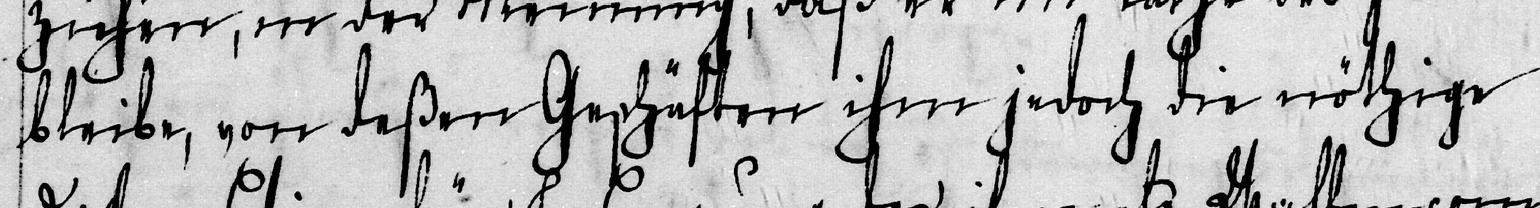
bleibe, von deßen Geschäften ihm jedoch die nöthige
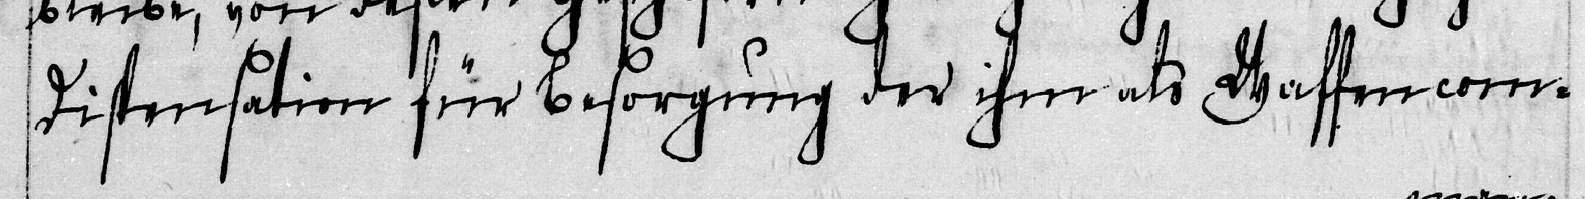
Dispensation für Besorgung der ihm als Waffencom-
